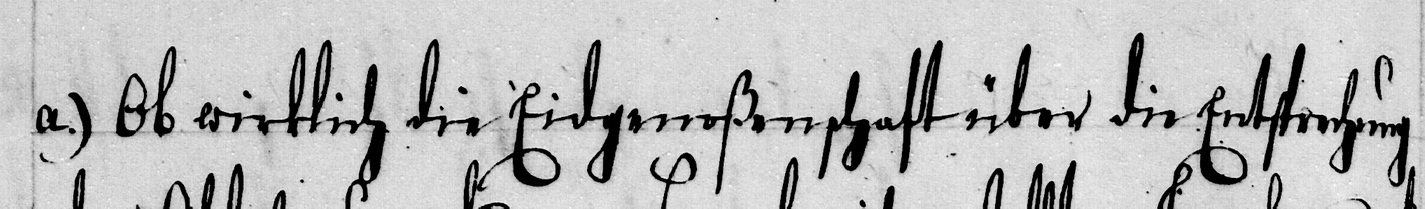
a.) Ob wirklich die Eidgenoßenschaft über die Entsprech¬
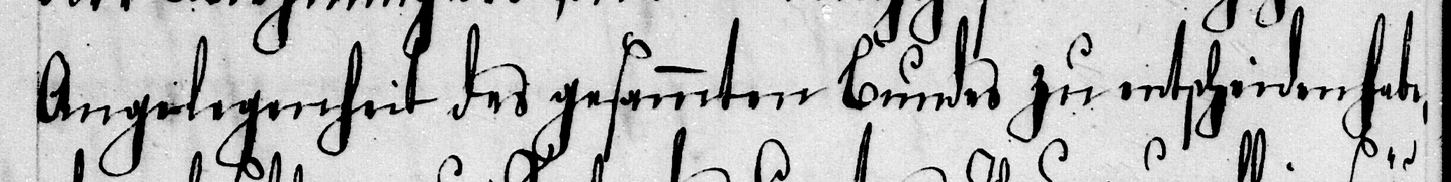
Angelegenheit des gesammten Bundes zu entscheiden habe,
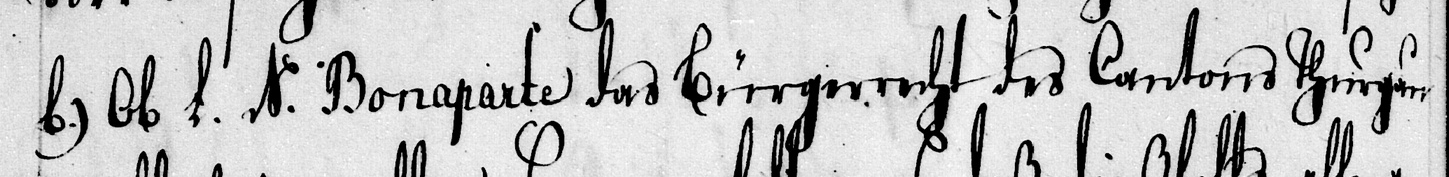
b.) Ob L. N. Bonaparte das Bürgerrecht des Cantons Thurgau
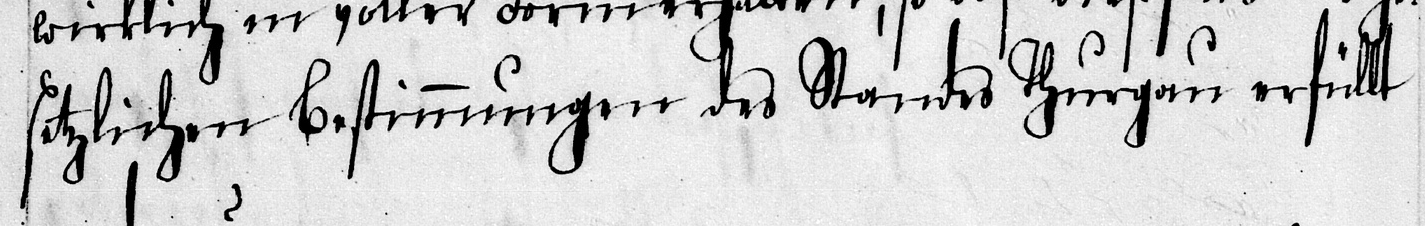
setzlichen Bestimmungen des Standes Thurgau erfüllt
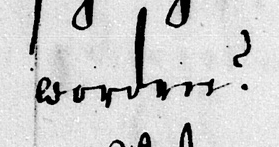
worden?
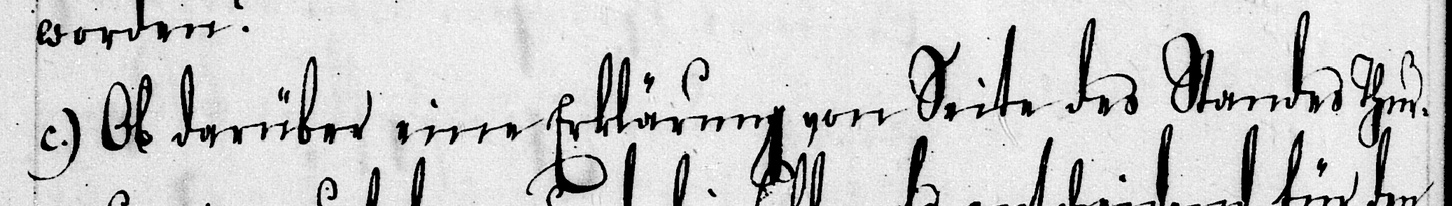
c.) Ob darüber eine Erklärung von Seite des Standes Thu¬
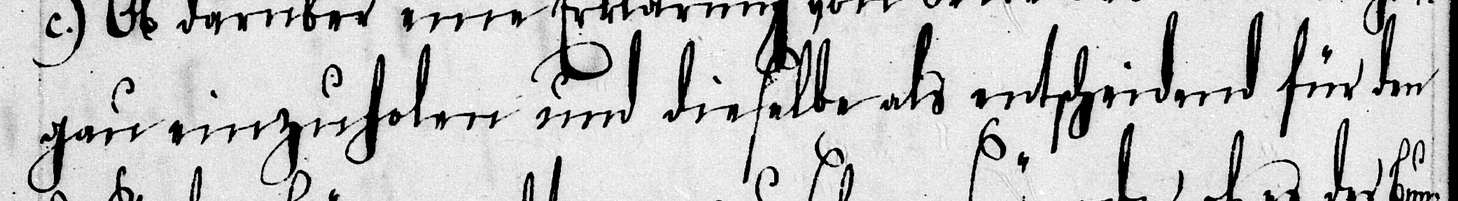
rgau einzuholen und dieselbe als entscheidend für den
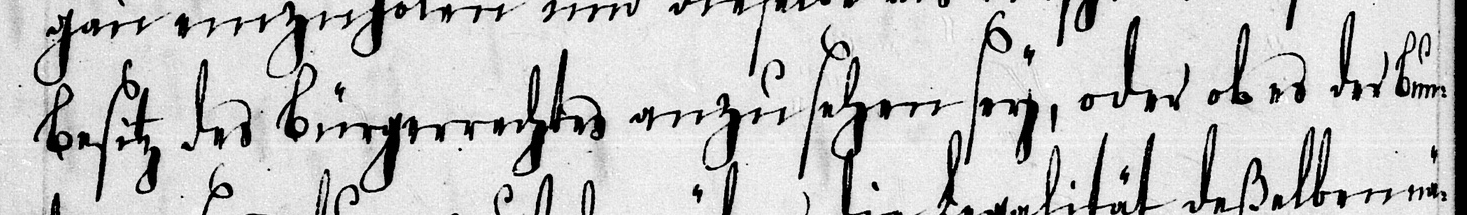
Besitz des Bürgerrechtes anzusehen sey, oder ob es der
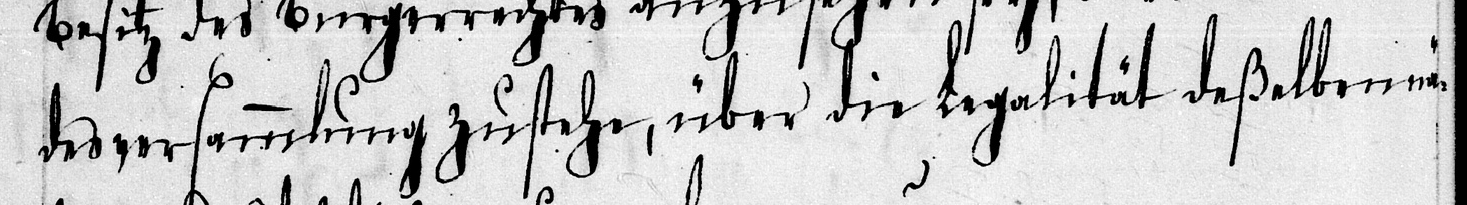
desversammlung zustehe, über die Legalität deßelben nä¬
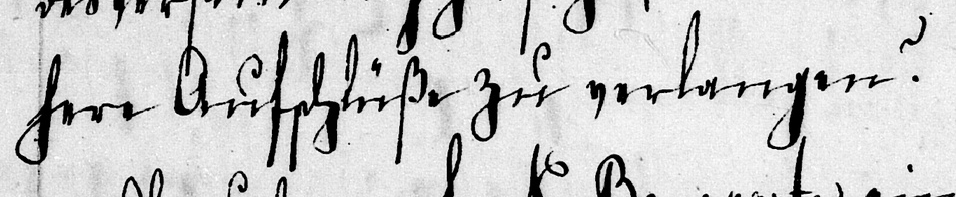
here Aufschlüße zu verlangen?
